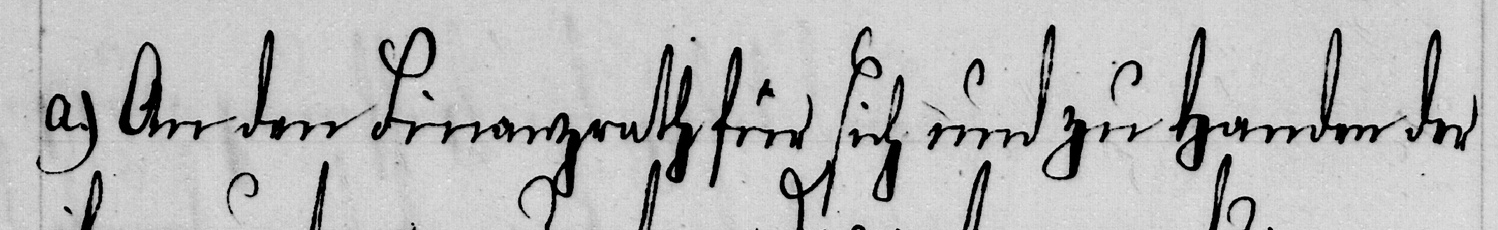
a.) An den Finanzrath für sich und zu Handen der
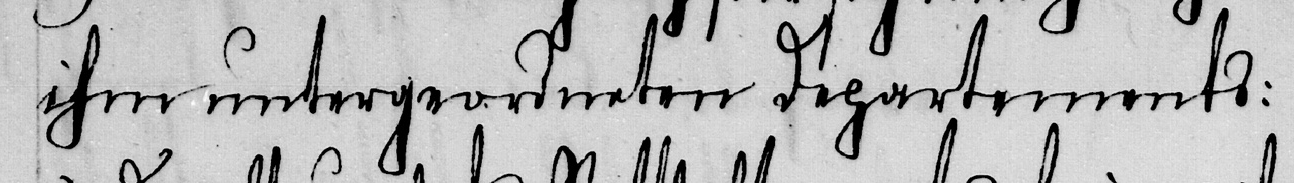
ihm untergeordneten Departements:
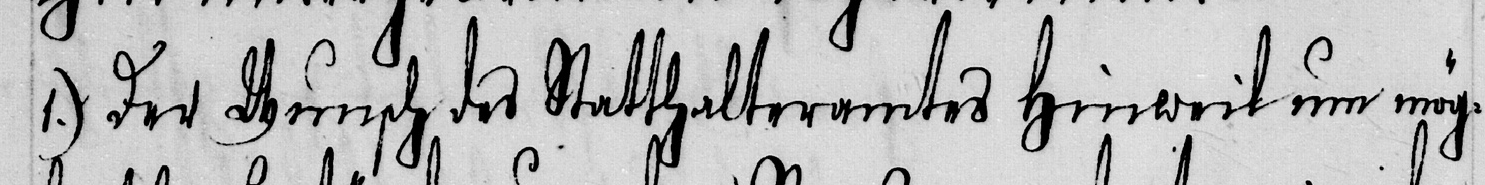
1.) Der Wunsch des Statthalteramtes Hinweil um mög¬
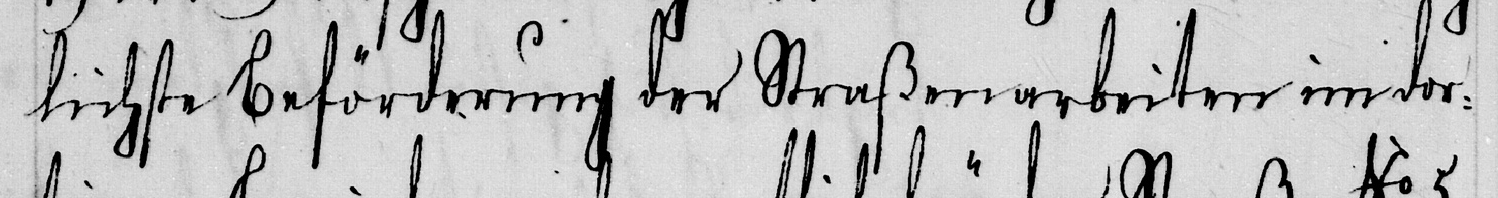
lichste Beförderung der Straßenarbeiten im dor¬
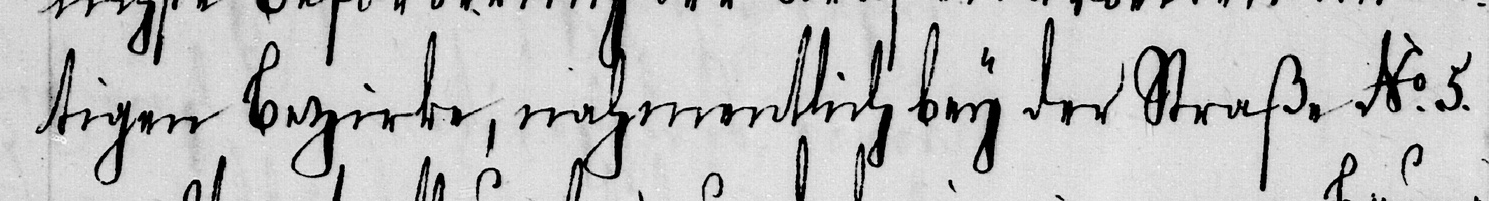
tigen Bezirke, nahmentlich bey der Straße No. 5.
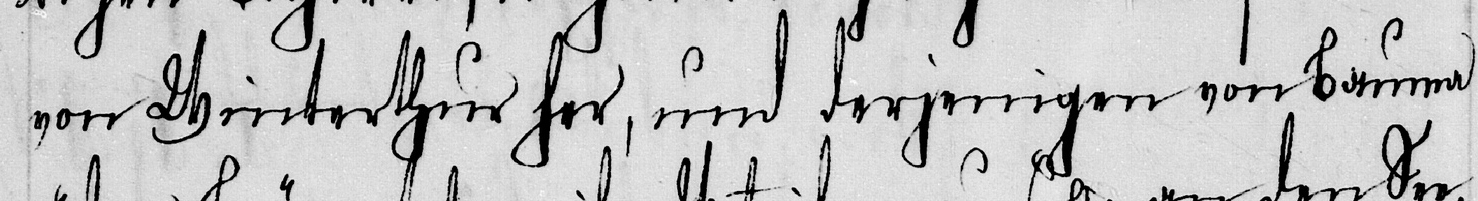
von Winterthur her, und derjenigen von Bauma
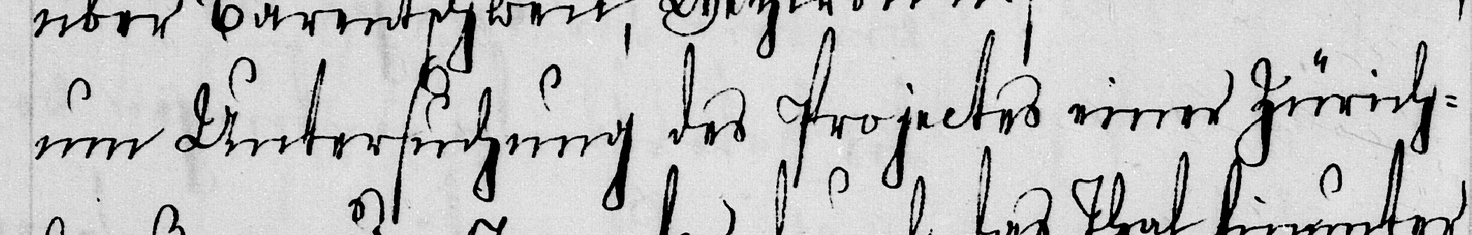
um Untersuchung des Projectes einer Zürich¬
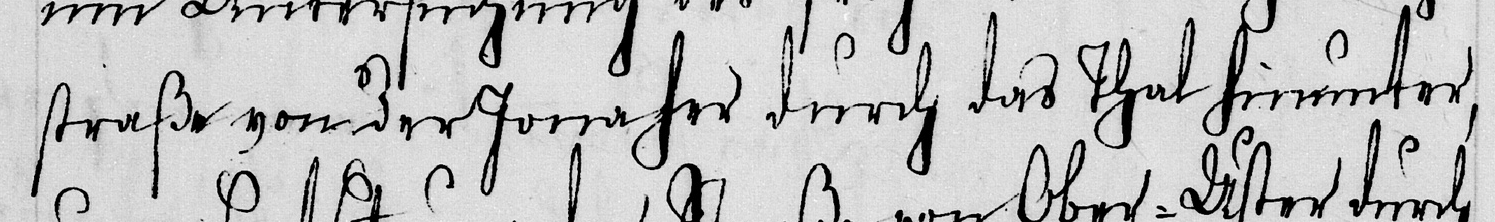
straße von der Jona her durch das Thal hinunter,
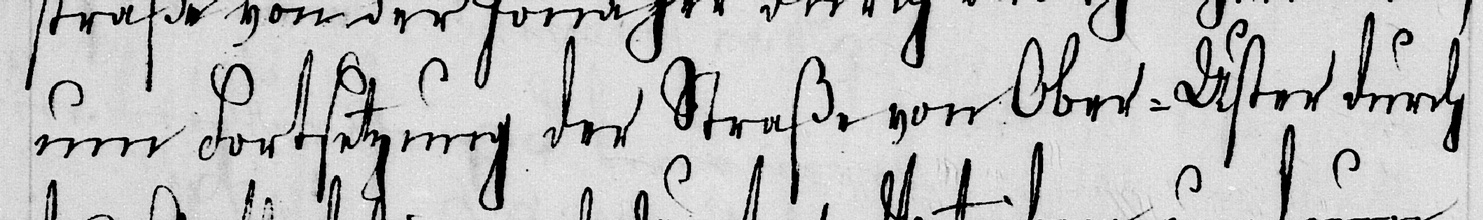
um Fortsetzung der Straße von Ober-Uster durch
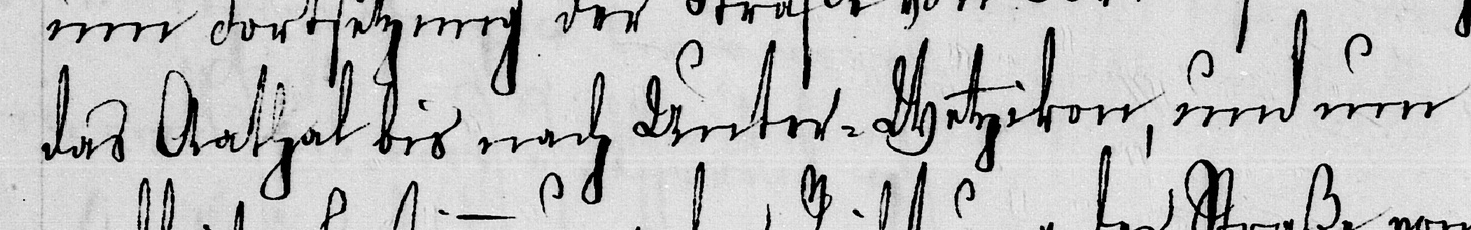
das Aathal bis nach Unter-Wetzikon, und um
